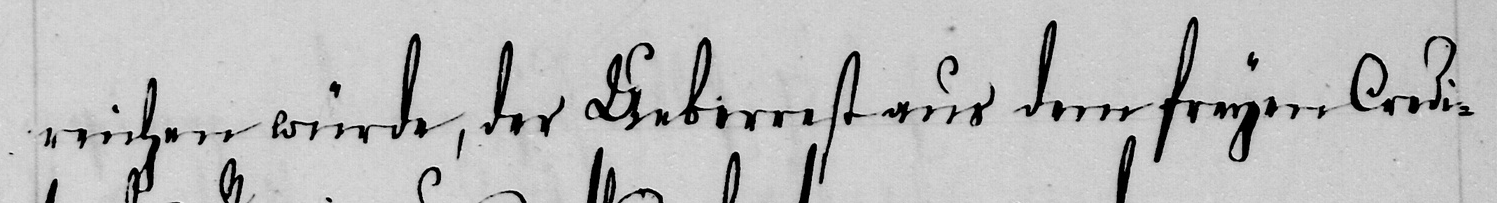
reichen würde, der Ueberrest aus dem freyen Credi¬
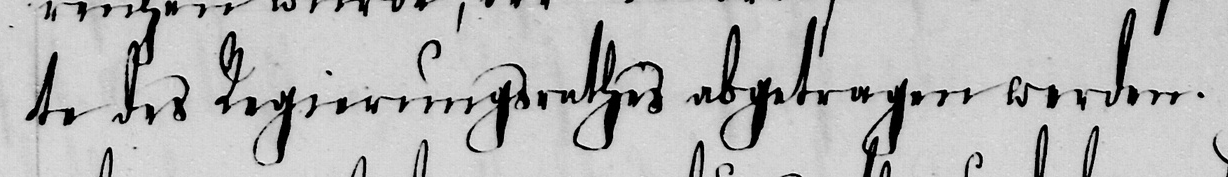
te des Regierungsrath abgetragen werden.
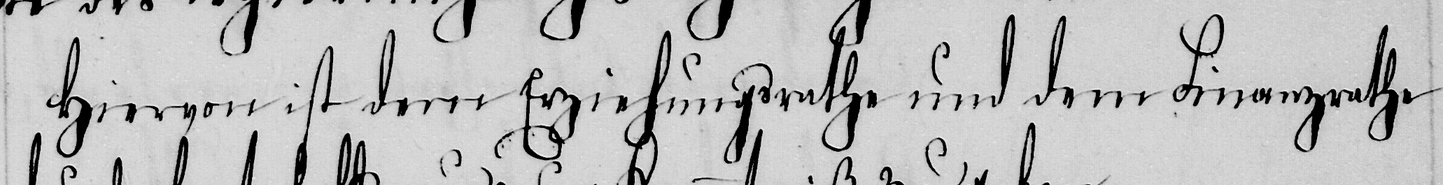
Hiervon ist dem Erziehungsrathe und dem Finanzrathe
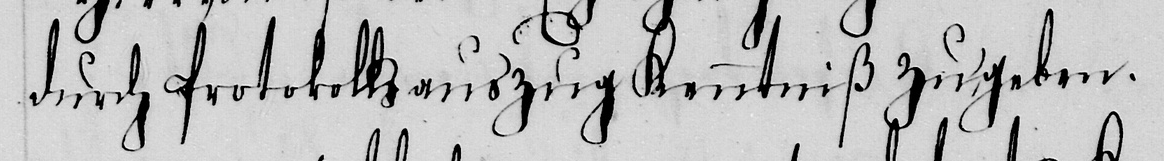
durch Protokollsauszug Kenntniß zu geben.
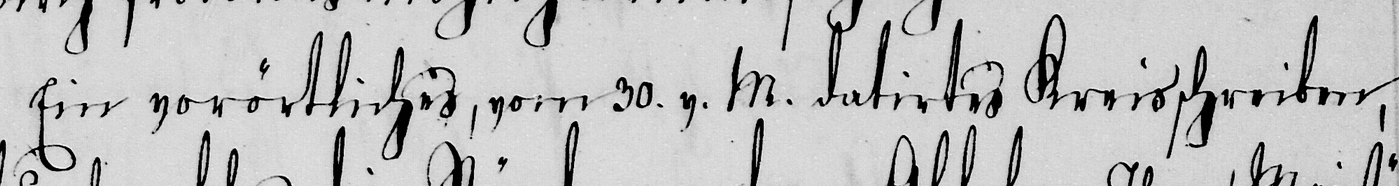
Ein vorörtliches, vom 30. v. M. datirtes Kreisschreiben,
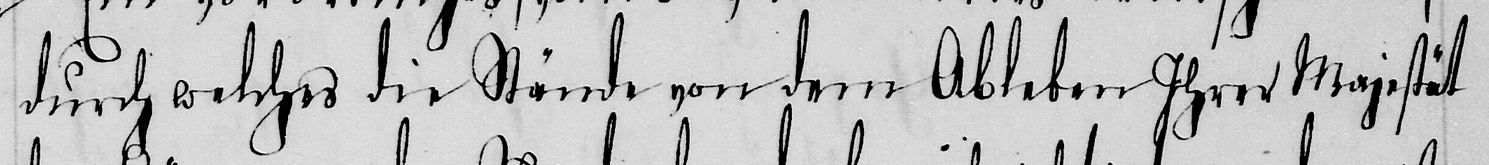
durch welches die Stände von dem Ableben Ihrer Majestät
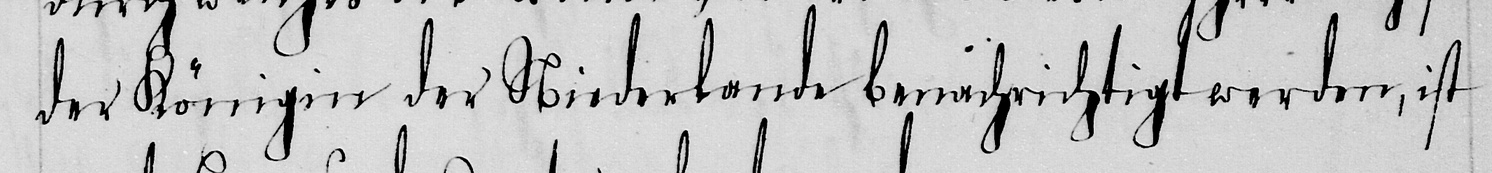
der Königin der Niederlande benachrichtigt werden, ist
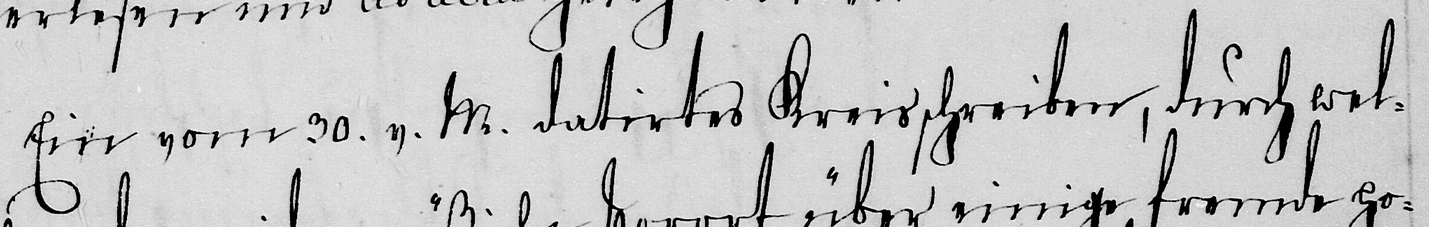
Ein vom 30. v. M. datirtes Kreisschreiben, durch wel¬
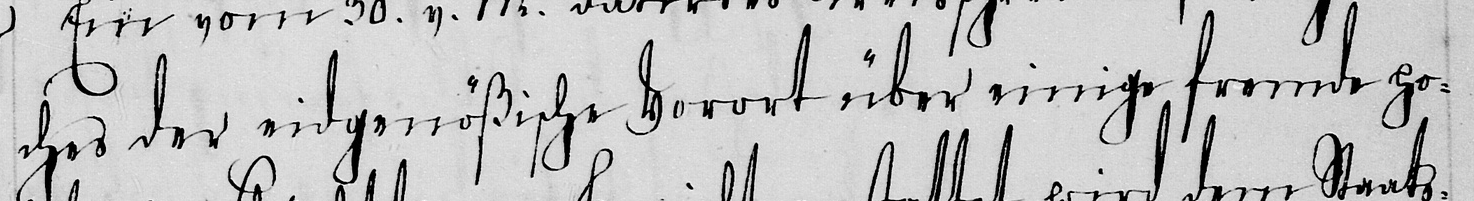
ches der eidgenößische Vorort über einige fremde po¬
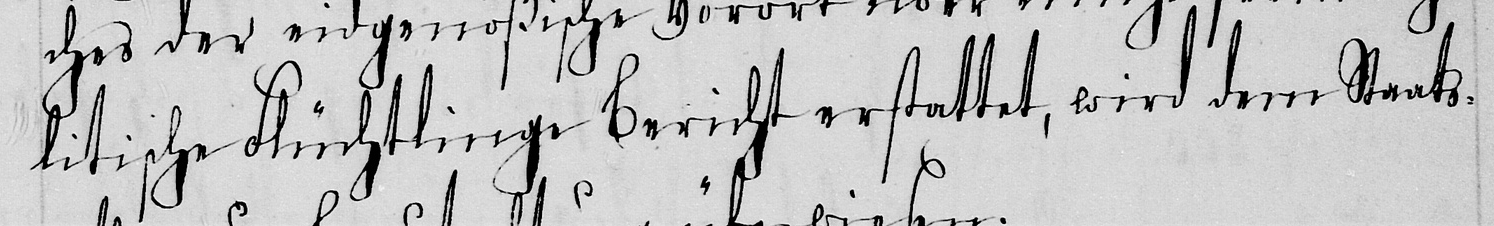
litische Flüchtlinge Bericht erstattet, wird dem Staats¬
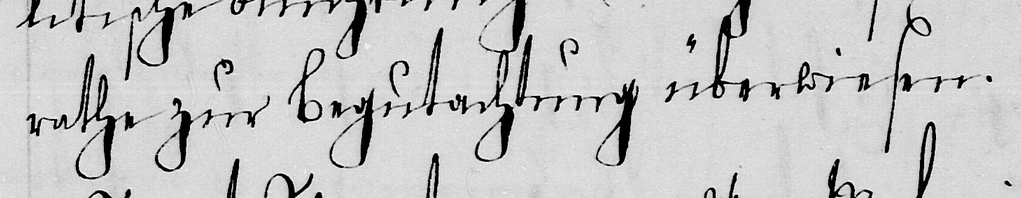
rathe zur Begutachtung überwiesen.
